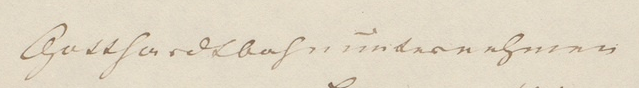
Gotthardtbahnunternehmen
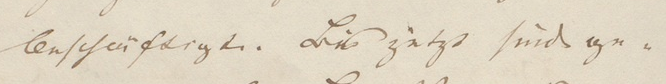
beschäftigt. Bis jetzt sind ge-
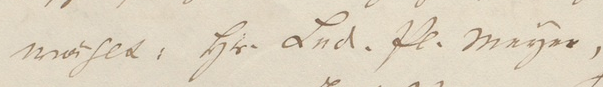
wählt: Hr. Lud. Pl. Meyer,
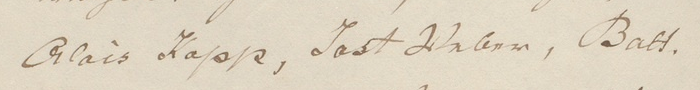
Alois Kopp, Jost Weber, Balt.
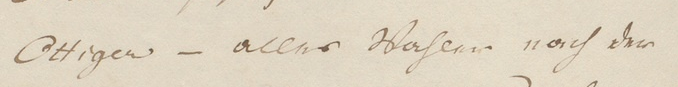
Ottiger – alles Wahlen nach der
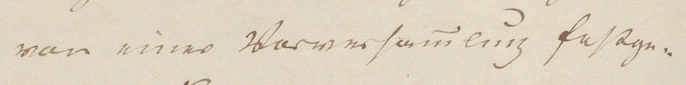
von einer Vorversammlung festge-
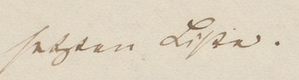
setzten Liste. –
